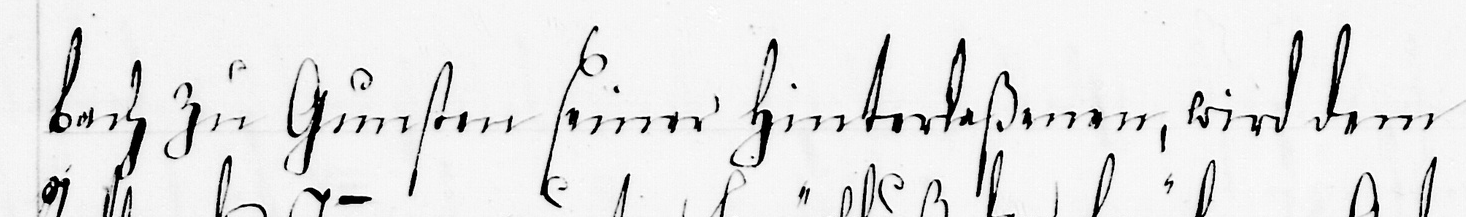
bach zu Gunsten seiner Hinterlaßenen, wird dem
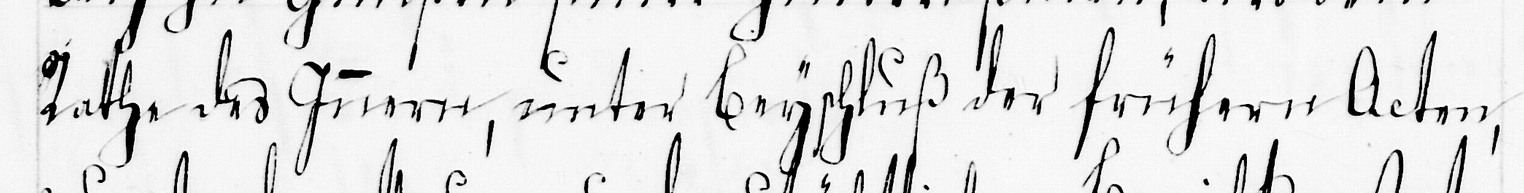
Rathe des Innern, unter Beyschluß der frühern Acten,
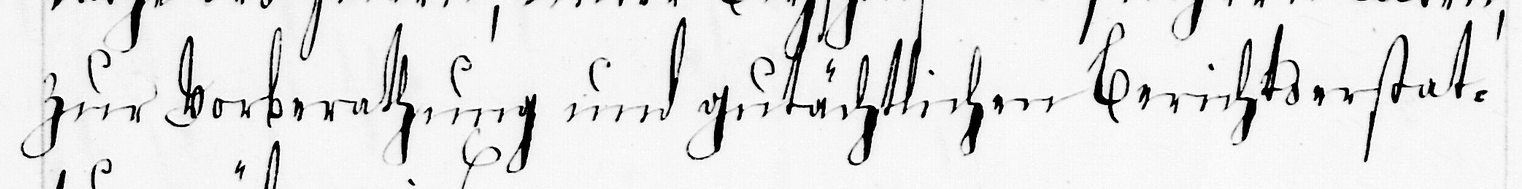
zur Vorberathung und gutächtlichen Berichtserstat¬
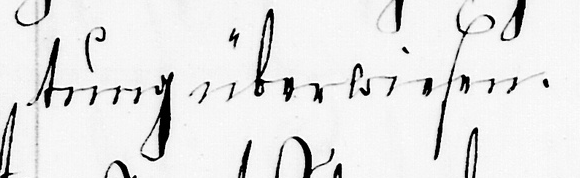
tung überwiesen.
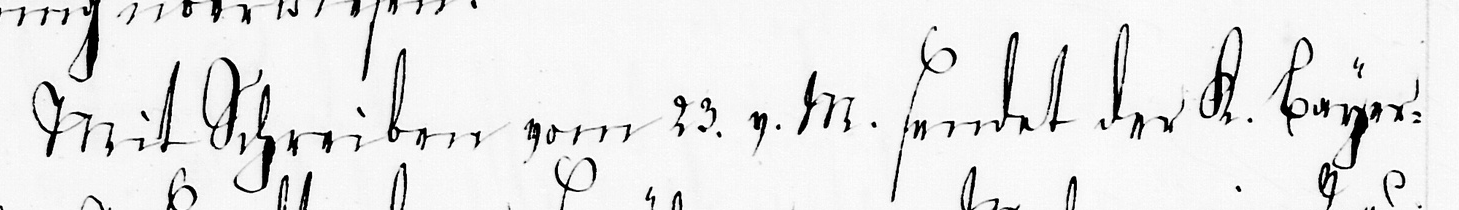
Mit Schreiben vom 23. v. M. sendet der K. Bayers¬
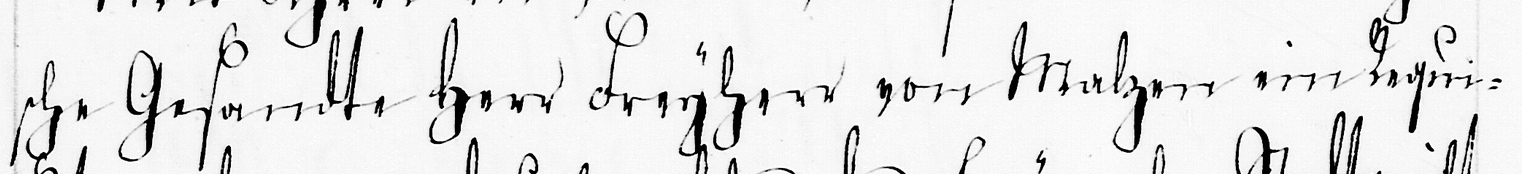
che Gesandte Herr Freyherr von Malzen ein Requi¬
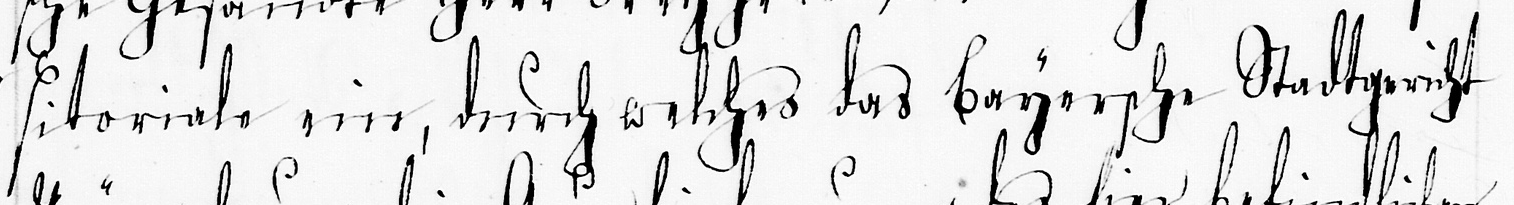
sitoriale ein, durch welches das Bayersche Stadtgericht
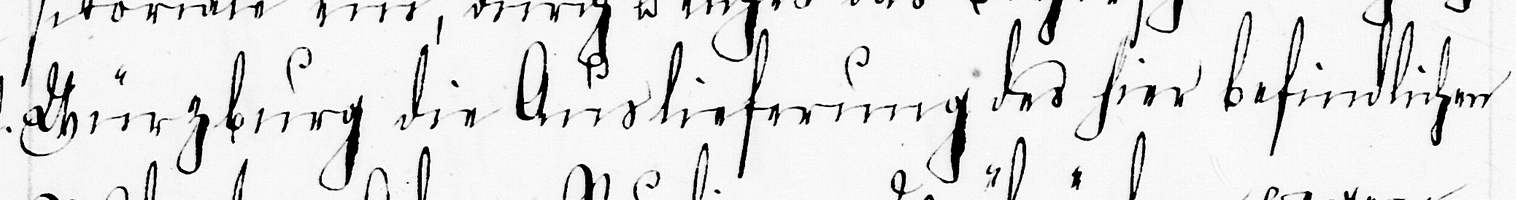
Würzburg die Auslieferung des hier befindlichen
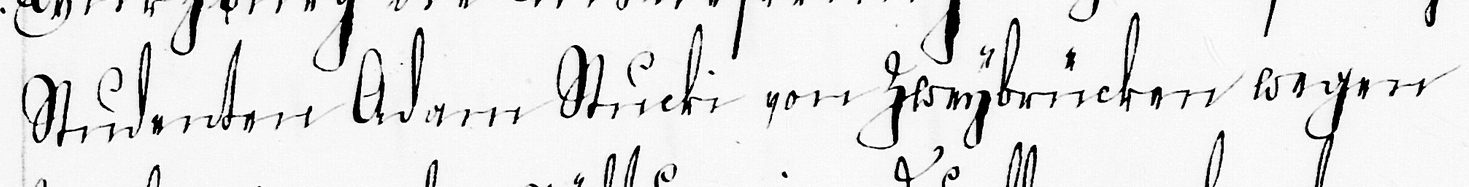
Studenten Adam Stucki von Zweybrücken wegen
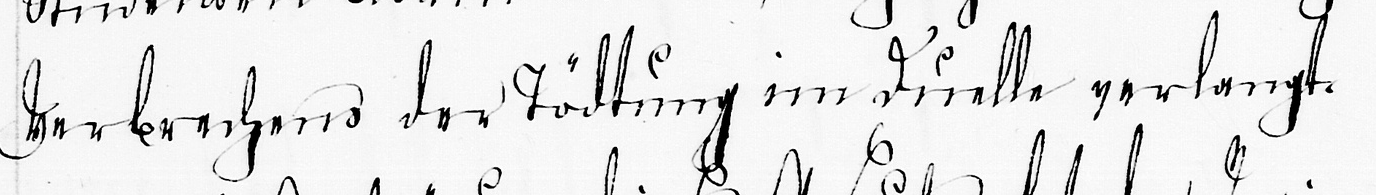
Verbrechens der Tödtung im Duelle verlangt.
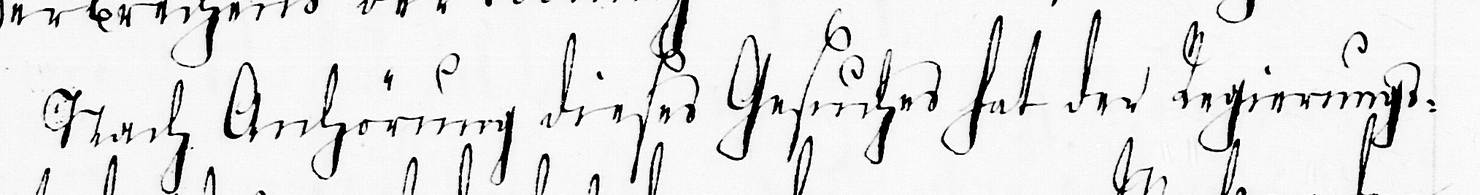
Nach Anhörung dieses Gesuches hat der Regierungs¬
